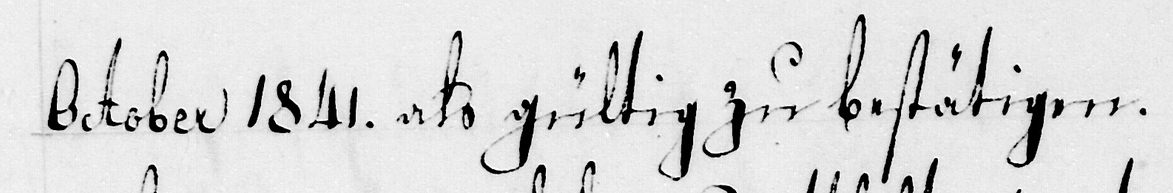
October 1841. als gültig zu bestätigen.
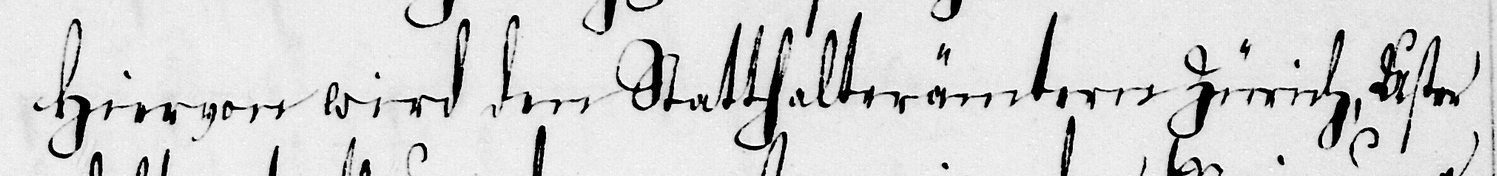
Hiervon wird den Statthalterämtern Zürich, Uster
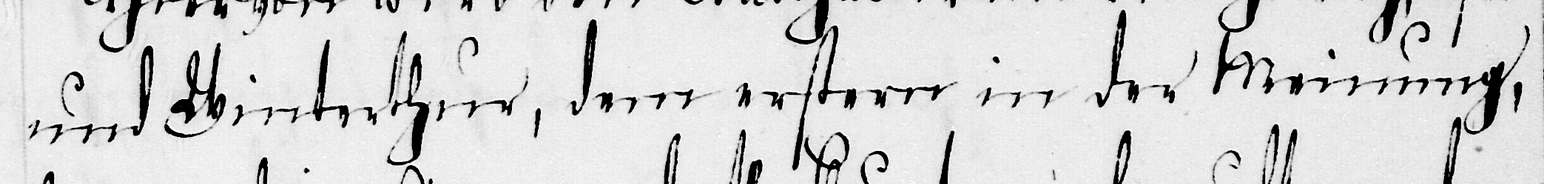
und Winterthur, dem erstern in der Meinung,
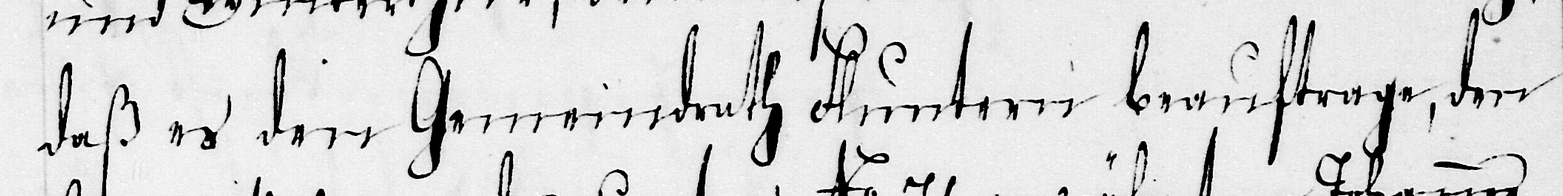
daß es den Gemeindrath Fluntern beauftrage, den
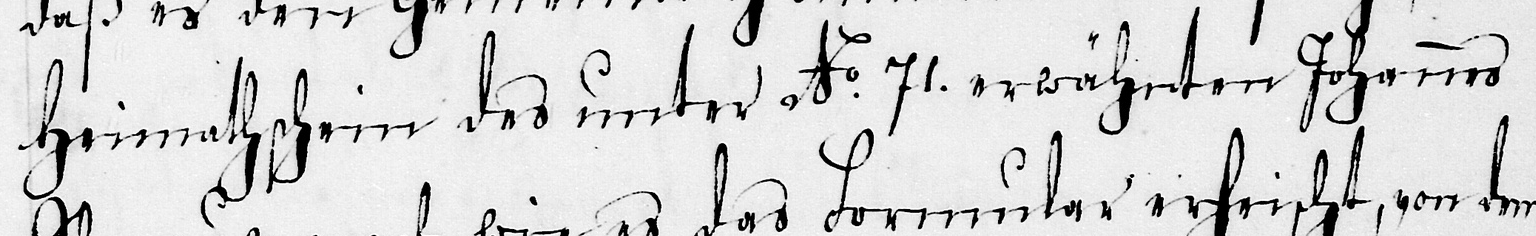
Heimathschein des unter No. 71. erwähnten Johannes
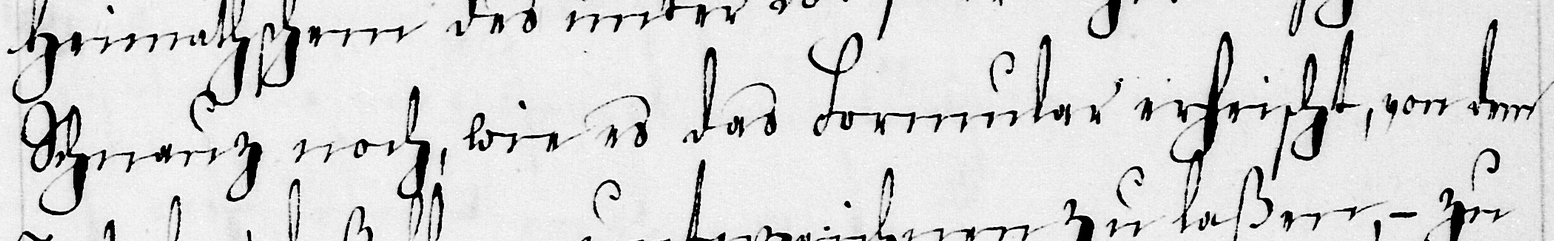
Schnauz noch, wie es das Formular erheischt, von dem
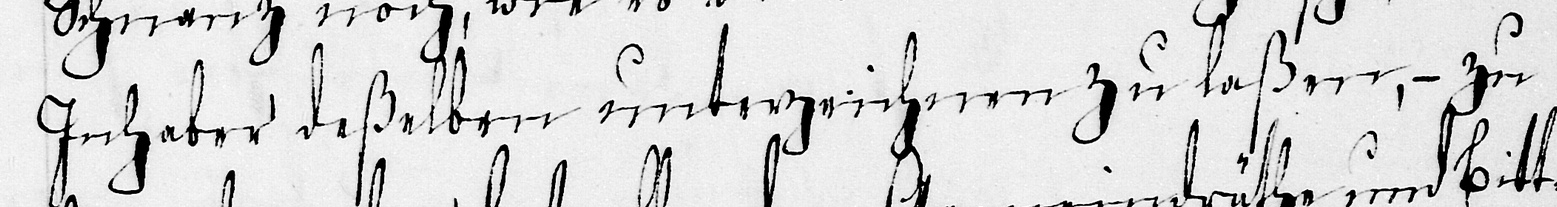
Inhaber deßelben unterzeichnen zu laßen, – zu
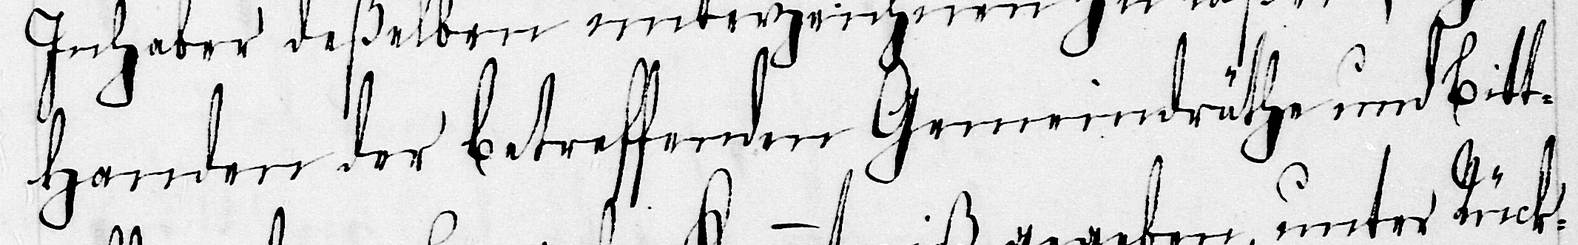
Handen der betreffenden Gemeindräthe und Bit¬
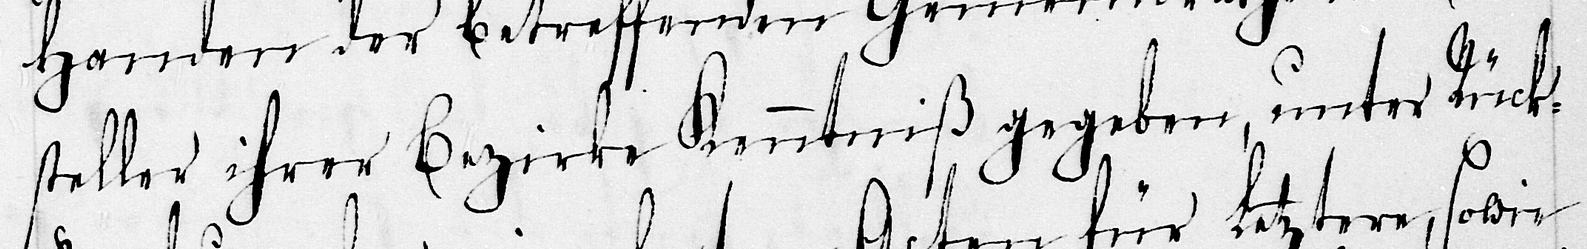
tsteller ihrer Bezirke Kenntniß gegeben, unter Rück¬
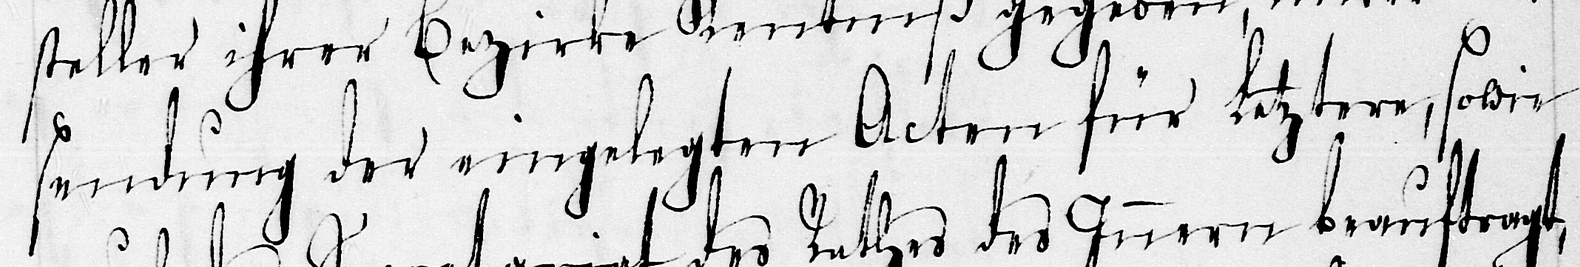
sendung der eingelegten Acten für Letztere, sowie
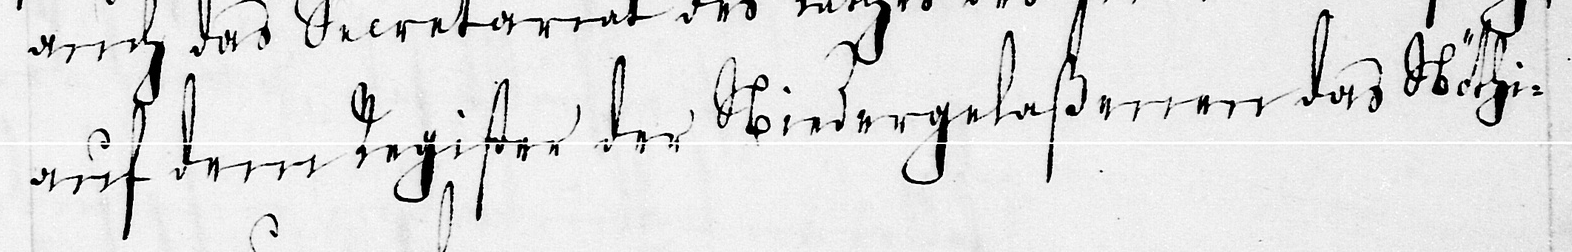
auf dem Register der Niedergelaßenen das Nöthi¬
